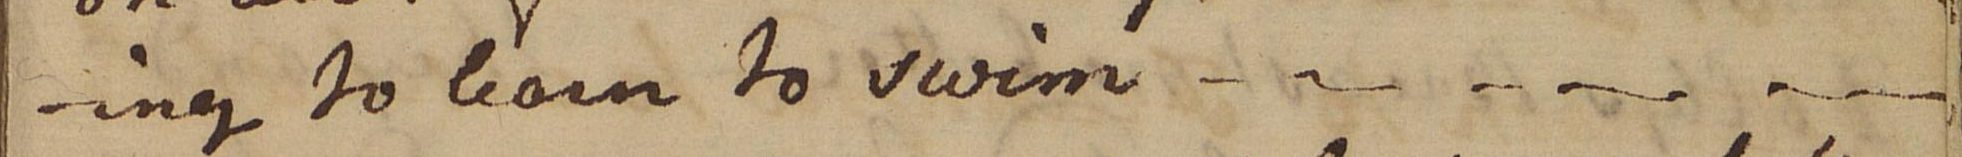-ing do learn to swim---- --
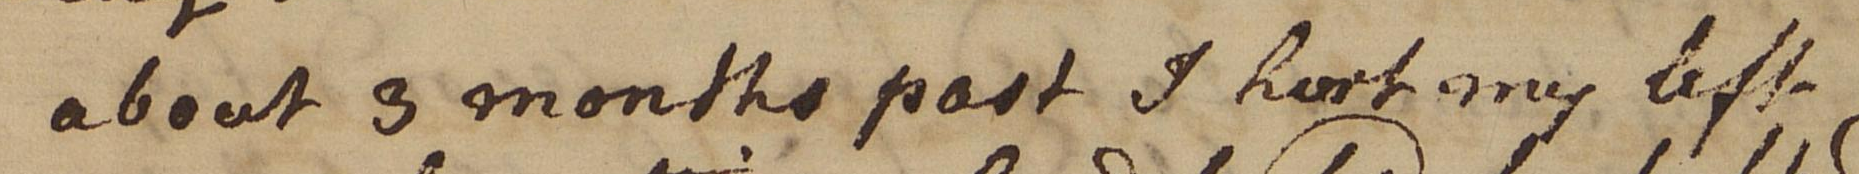about 3 months past I hurt my left
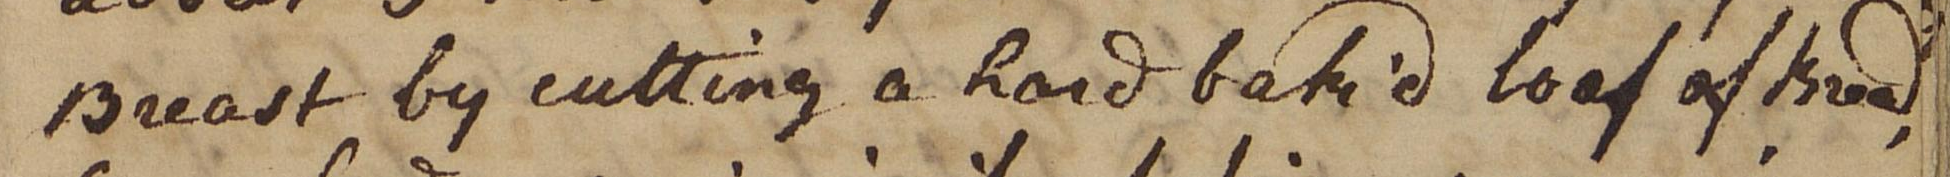Breast by cutting a hard bake'd loaf of Bred
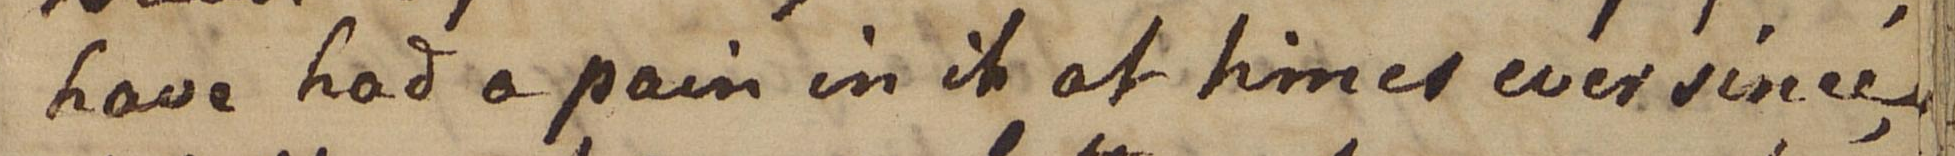have had a pain in it at times ever since
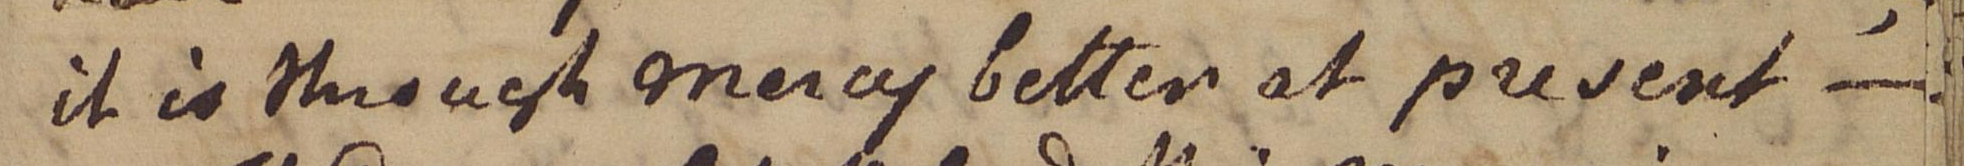it is through mercy better at present-
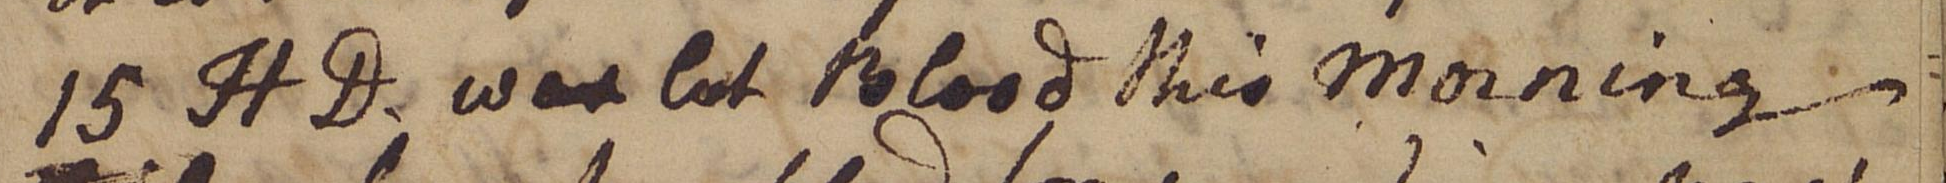15 HD was let Blood this morning-
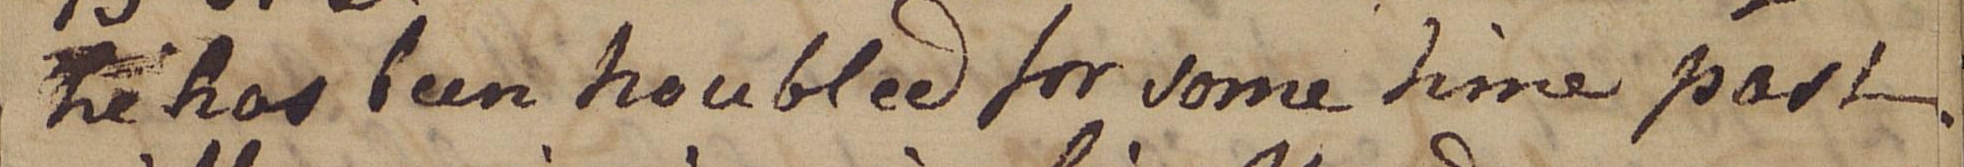he has been troubled for some time past-
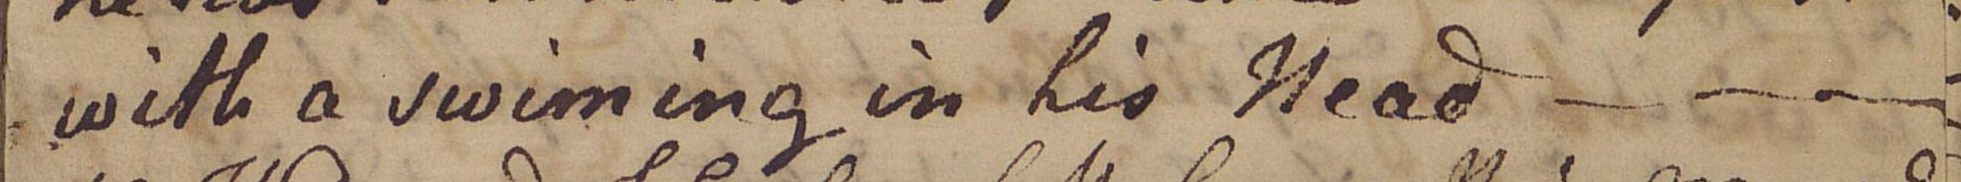with a swiming in his Head---
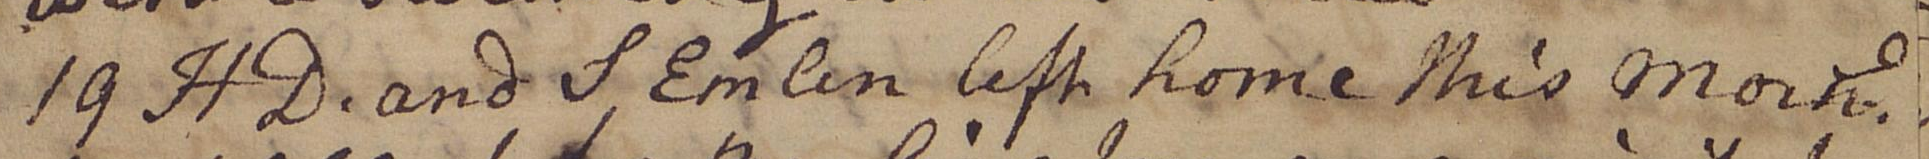19 HD and S Emlen left home this Morn.^g
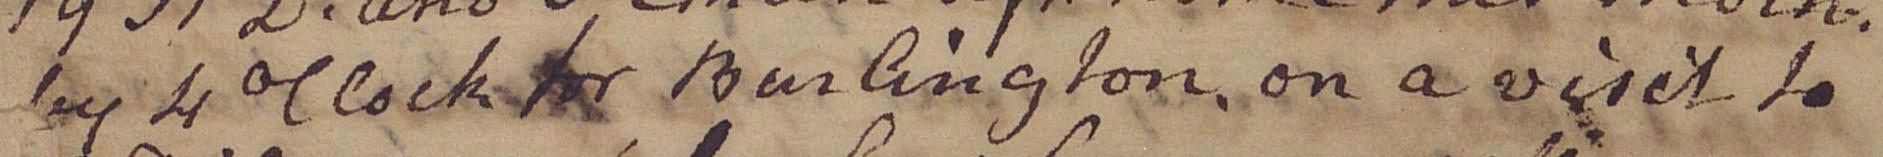by 4 ^o Clock for Burlington on a visit to
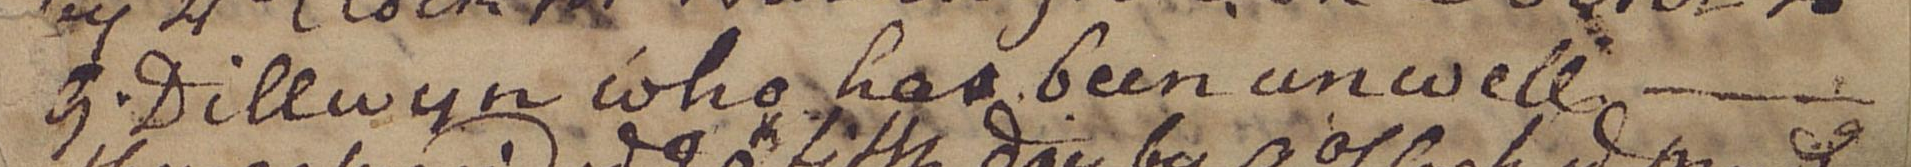G. Dillwyn who has been unwell-
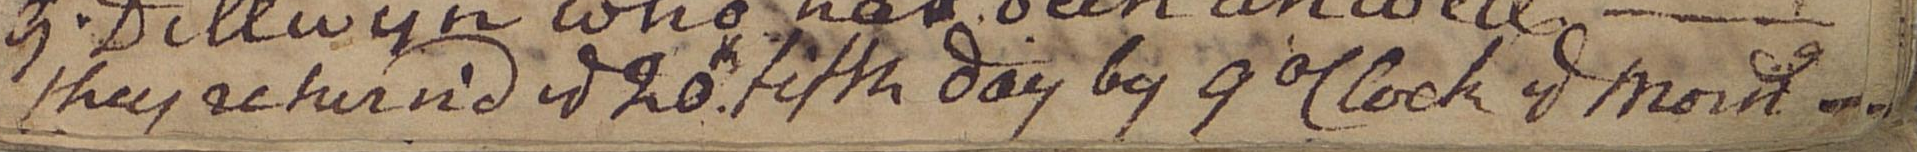they return'd y^e 20^th. fifth day by 9 ^o Clock y^e morn^g
